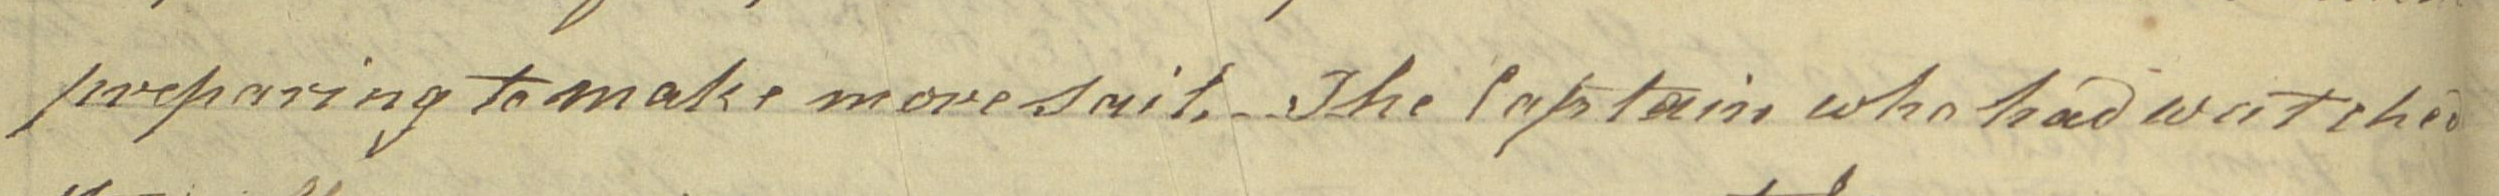preparing to make more sail. The Captain who had watched
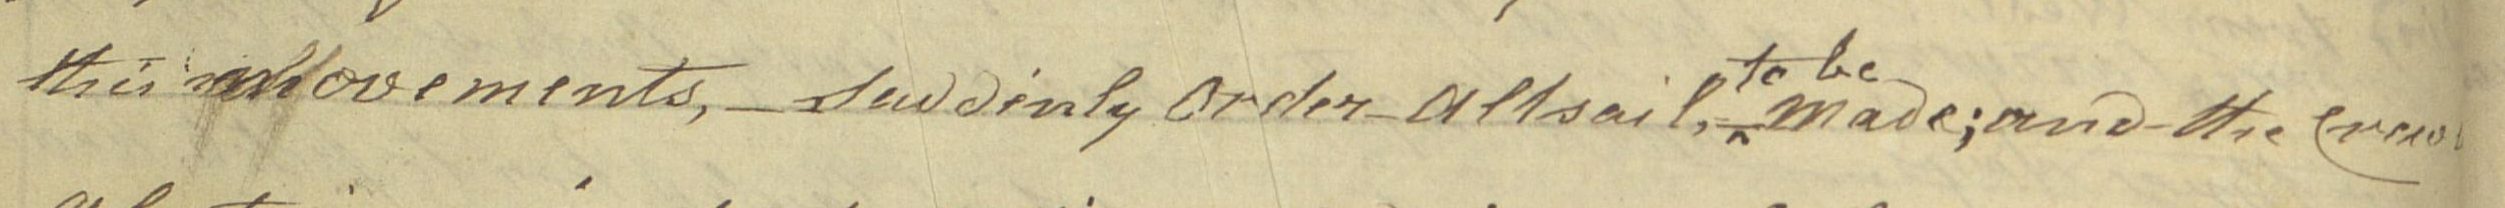this movements, suddenly Order All sail ^ Made; and the crew
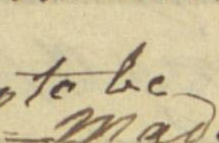to be
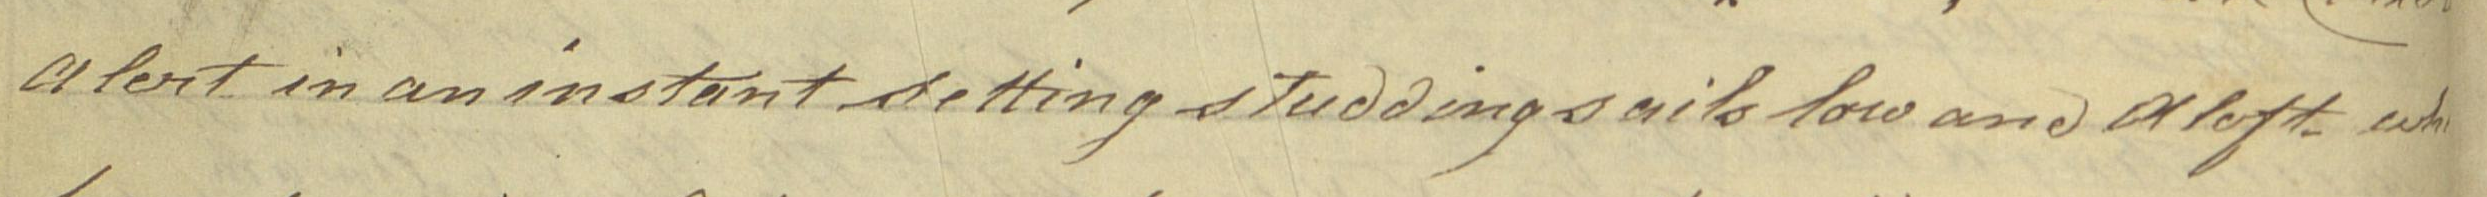alert in an instant setting studding sails low and Aloft wh-
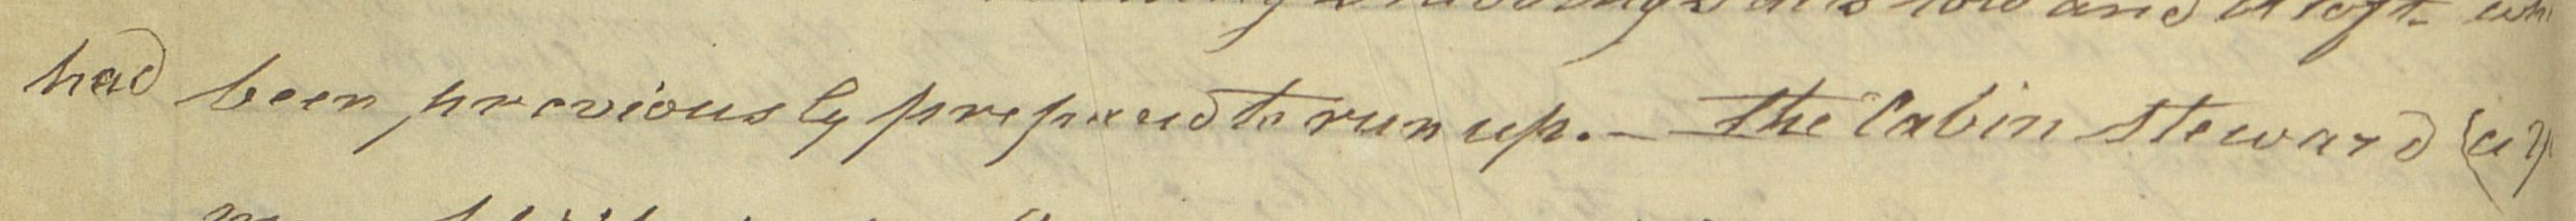had been previously prepared to run up. the Cabin Steward (a y-
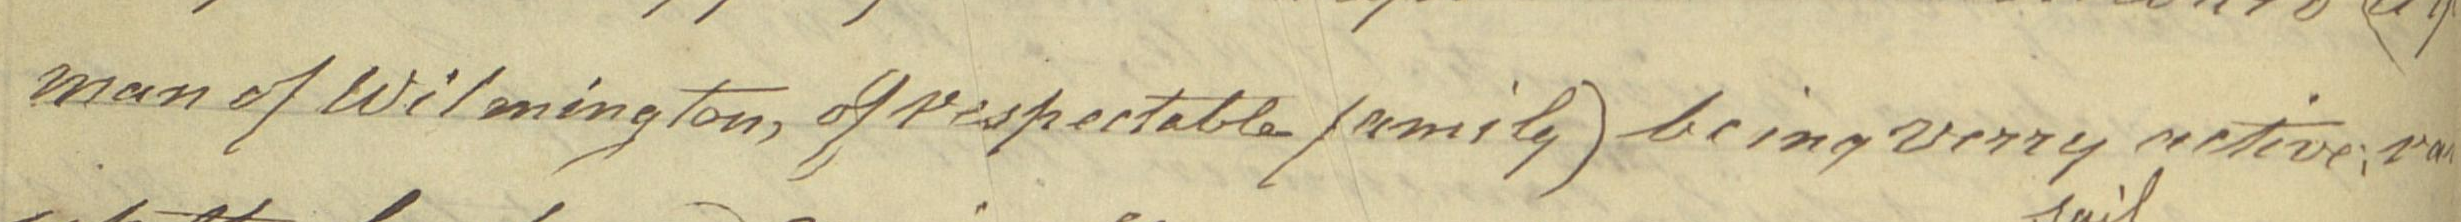man of Wilmington, of respectable family) being verry active; r-
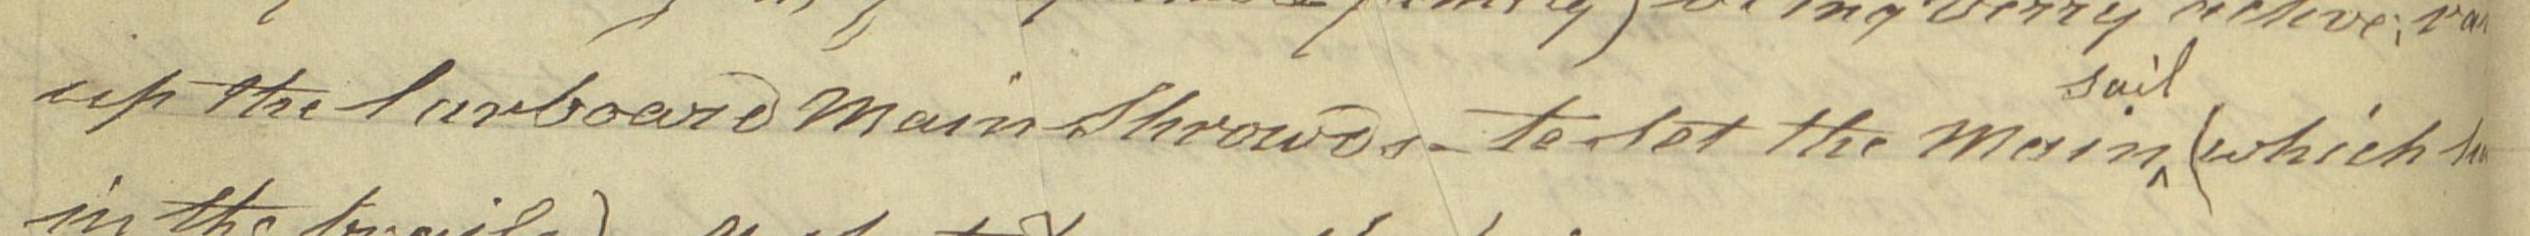up the lurboard Main Shrowds to Set the Main ^ (which h-
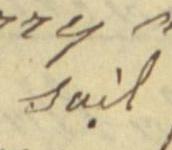sail
